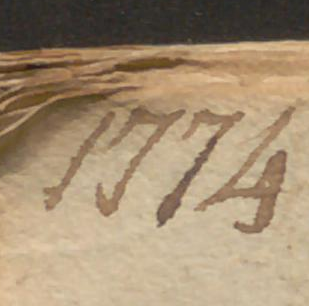1774
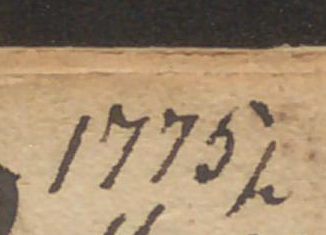1775
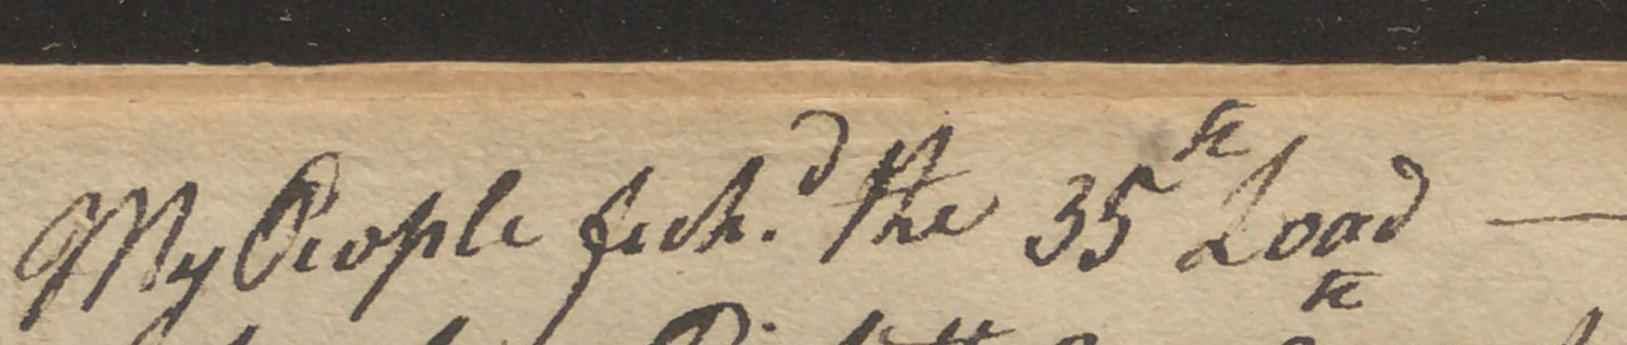My People fech^d. the 35th Load-
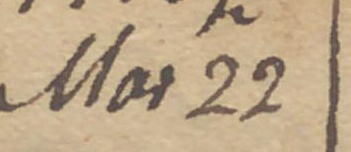Mar 22
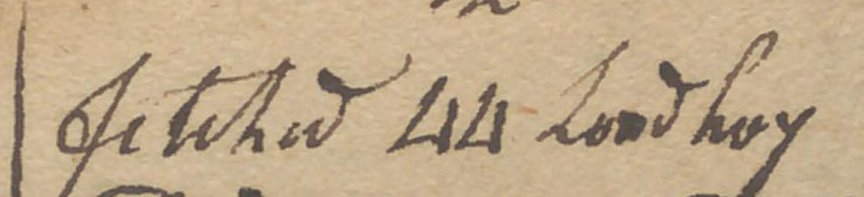fetched 44^th Load hay
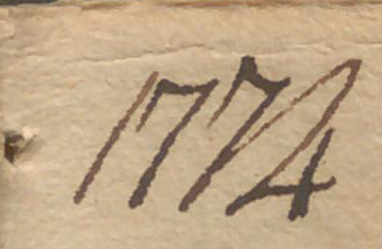1774
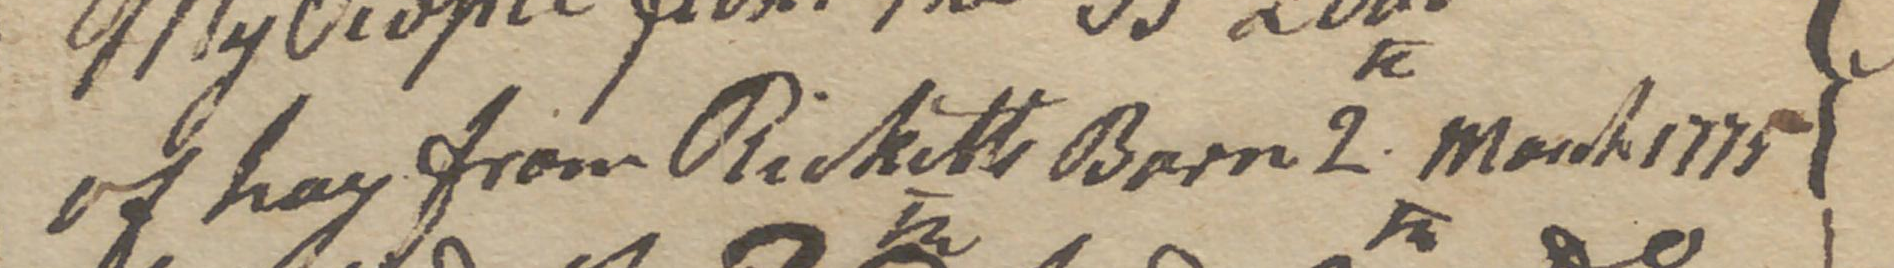of hay from Ricketts Barn 2 March 1775
